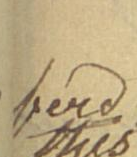ferd to
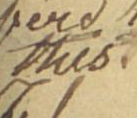this
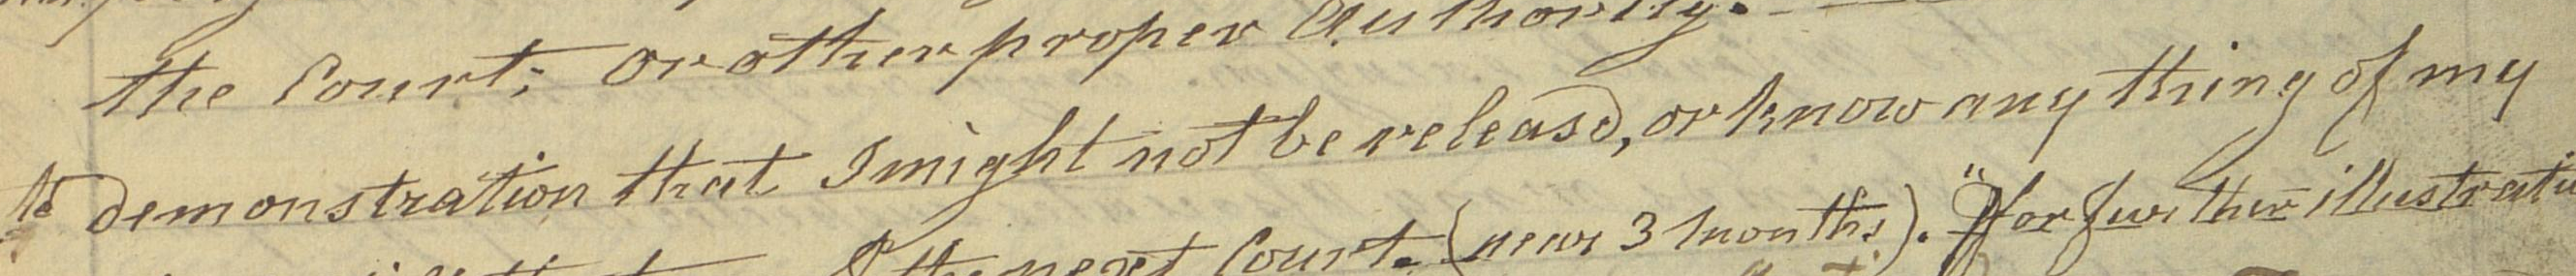demonstration that I might not be releasd, or know any thing of my
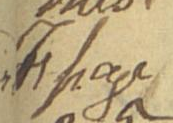Flag
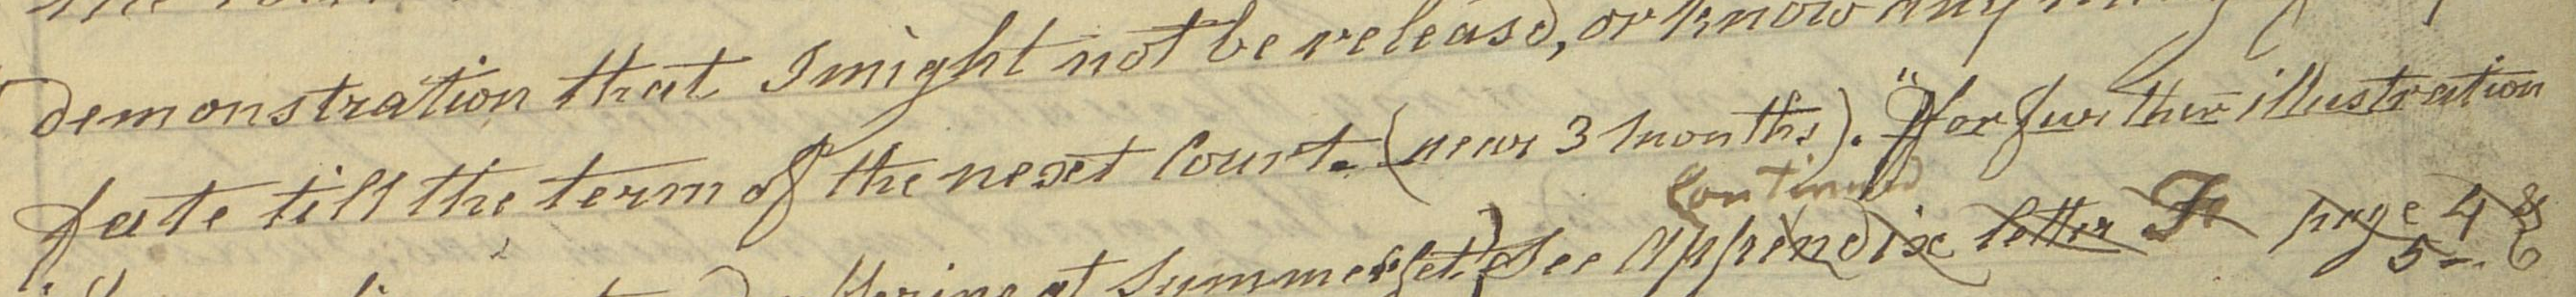fate till the term of the next Court (new 3 months). for five then illustration
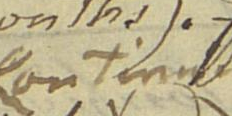Continued
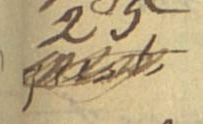-est
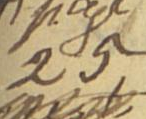25
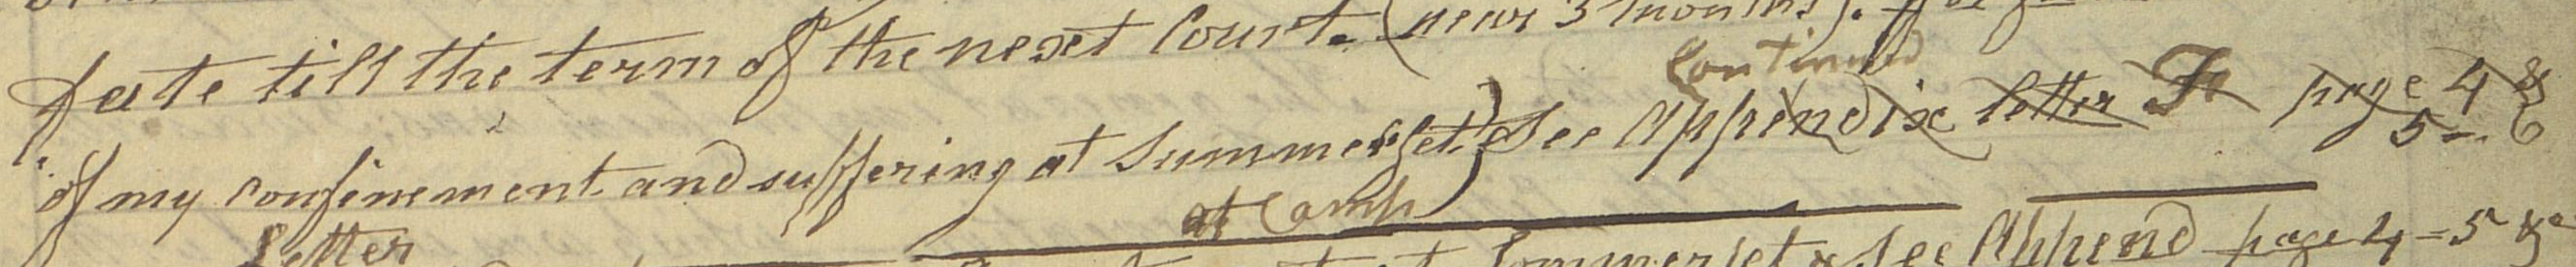of my confinement and suffering at summerset) See Appendix letter F page 48
